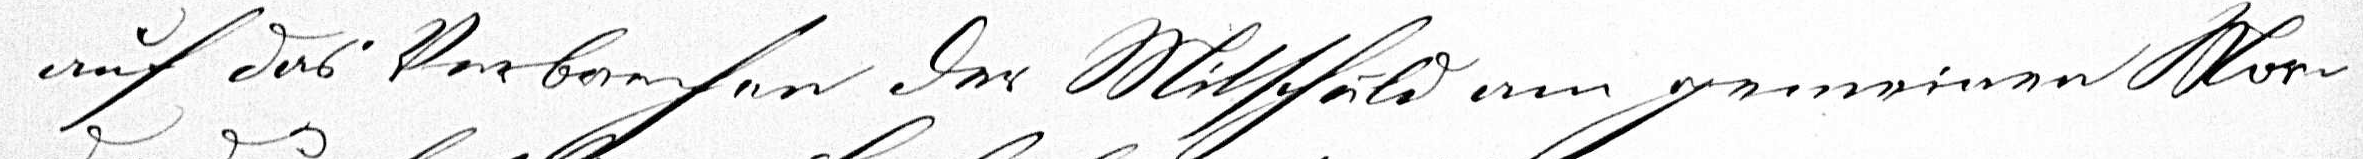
auf das Verbrecehn der Mitschuld am gemeiner Mor¬
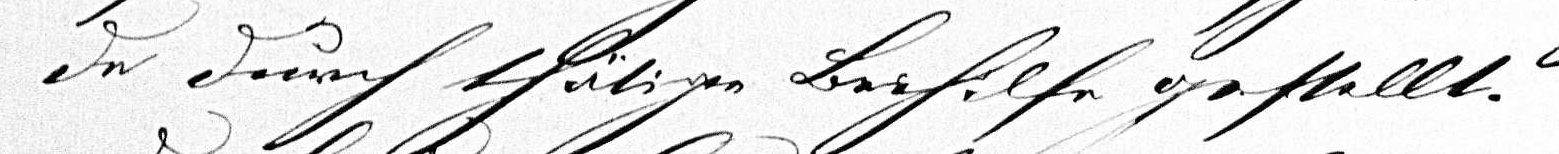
de durch thätige Beihilfe gestellt.
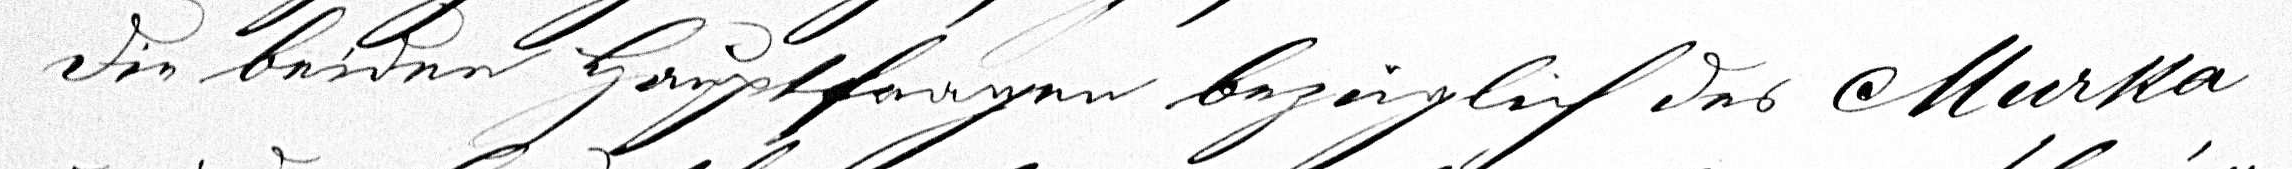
Die beiden Hauptfragen bezüglich des Murka
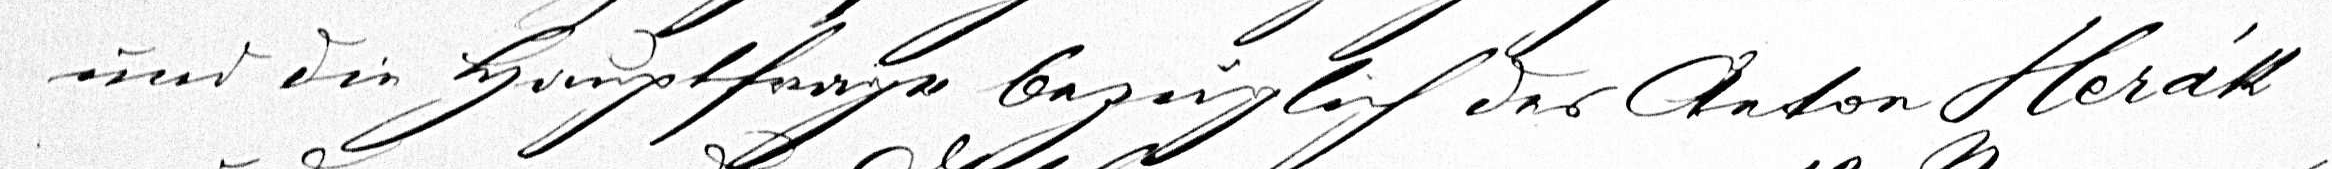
und die Hauptfrage bezüglich des Anton Herák
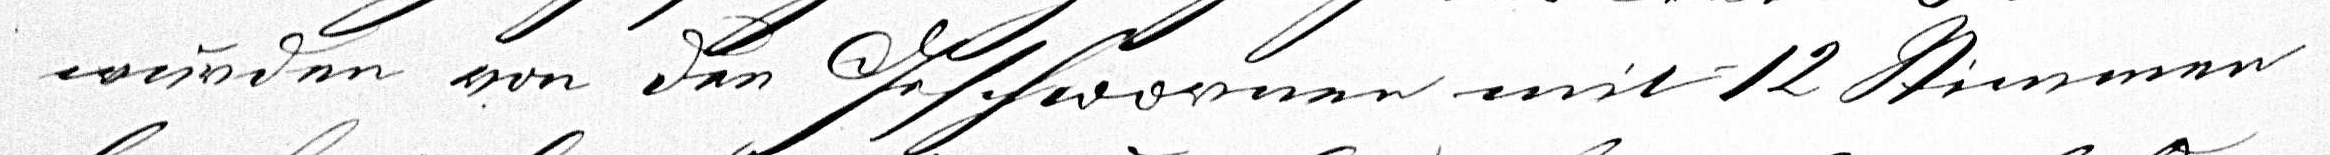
wurden von den Geschwornen mit 12 Stimmen
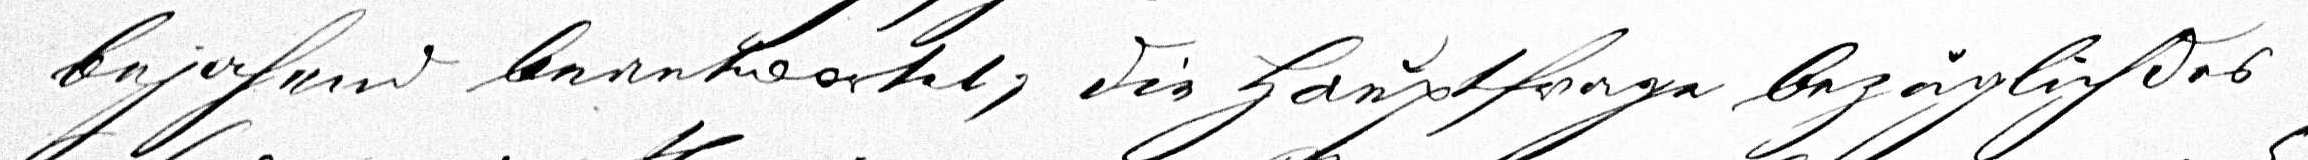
bejahend beantwortet, die Hauptfrage bezüglich des
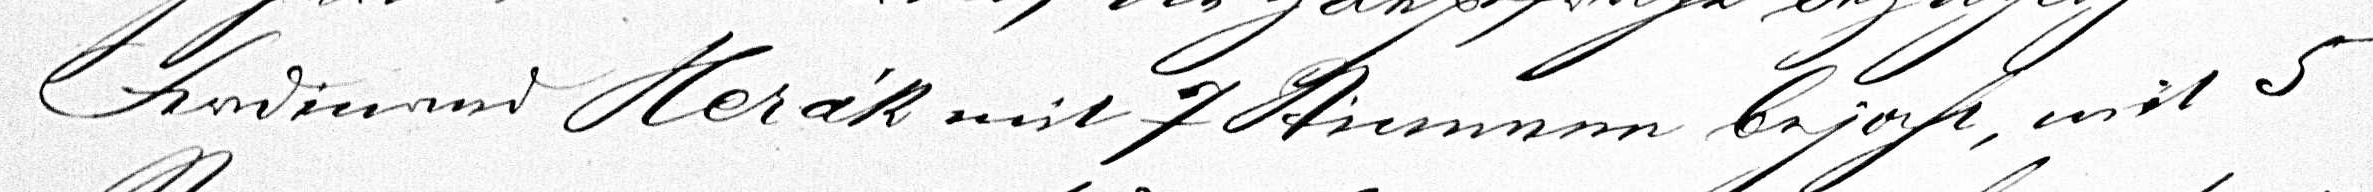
Ferdinand Herák mit 7 Stimmen bejaht , mit 5
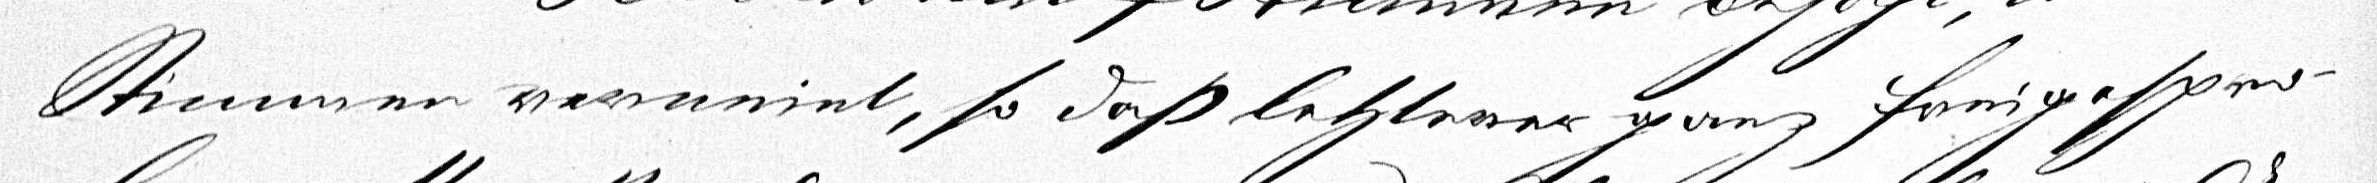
Stimmen verneint, so daß letzterer ganz freigespro¬
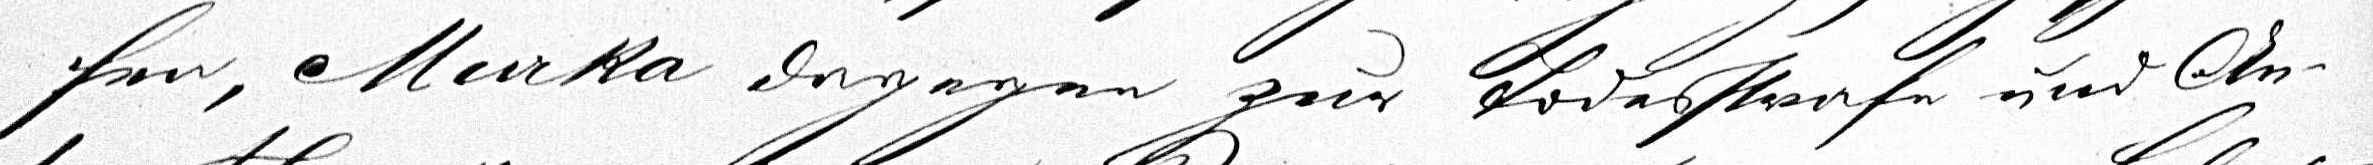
chen, Murka dagegen zur Todesstrafe und An¬
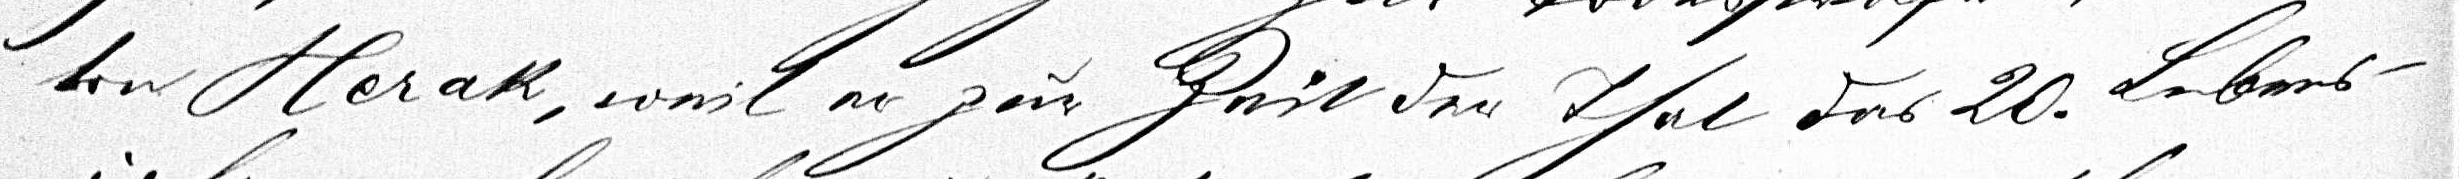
ton Herak, weil er zu Zeit der That das 20. Lebens¬
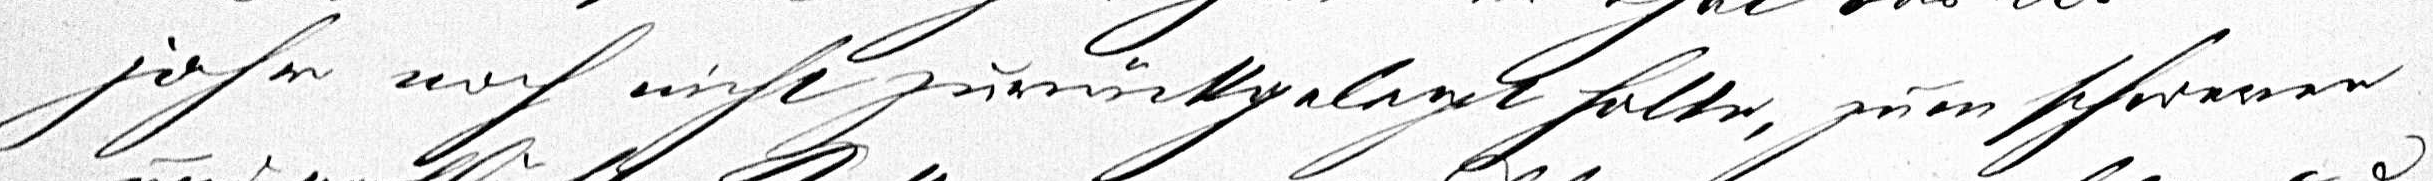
jahr noch nicht zurückgelegt hatte zum schweren
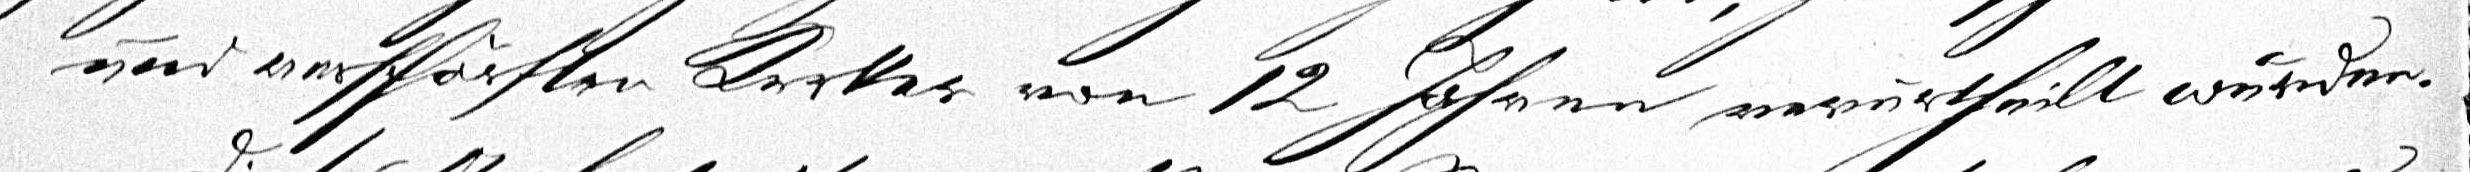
und verschärtfen Kerker von 12 Jahren verurtheilt wurden.
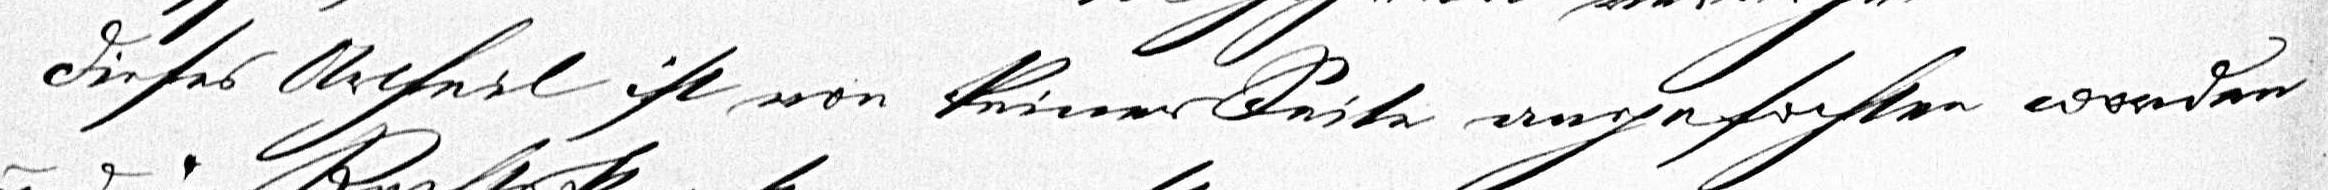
Dieses Urtheil ist von keiner Seite angefochten worden
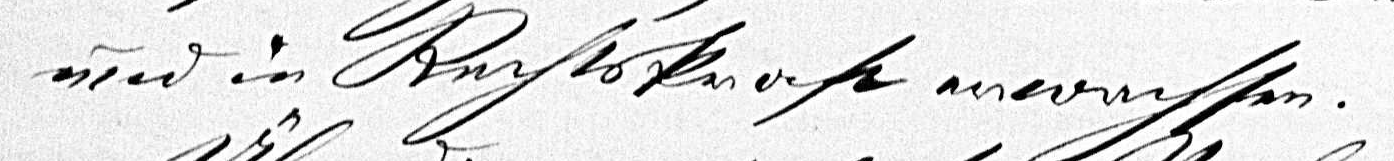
und n Rechtskraft erwachsem.
